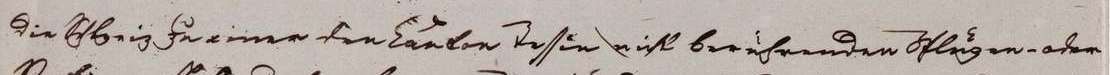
die Schweiz zu einer den Canton Tessin nicht berührenden Splügen- oder
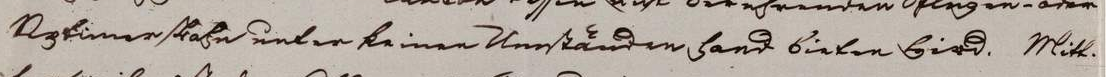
Septimer Bahn unter keinen Umständen Hand bieten wird. Mitt-
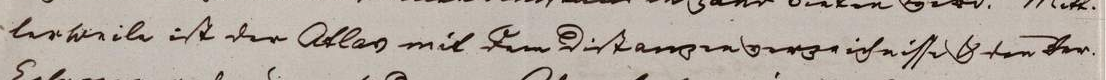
lerweile ist der Atlas mit dem Distanzenverzeichnisse & den Ver-
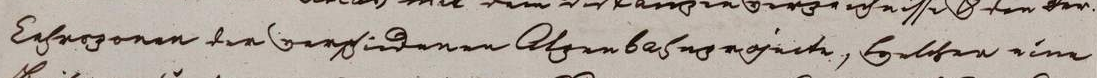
kehrszonen der verschiedenen Alpenbahnprojecte, welcher eine
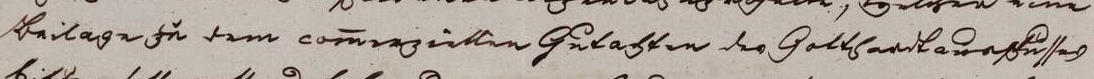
Beilage zu dem commerziellen Gutachten des Gotthardtausschusses
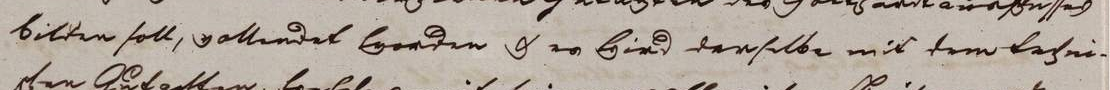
bilden soll, vollendet worden & es wird derselbe mit dem techni-
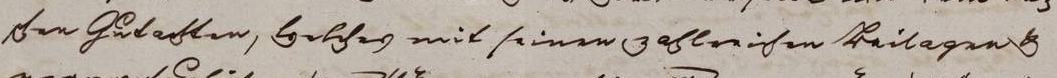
schen Gutachten, welches mit seinen zahlreichen Beilagen &
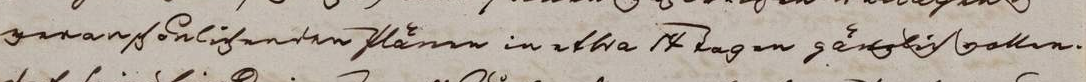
veranschaulichenden Plänen in etwa 14 Tagen gänzlich vollen-
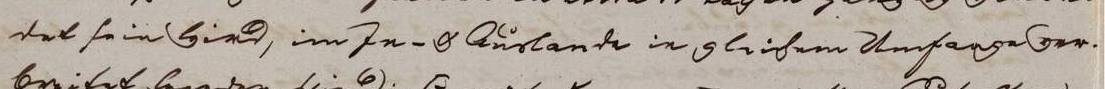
det sein wird, im In- & Auslande in gleichem Umfange ver-
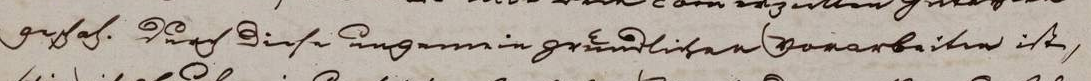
geschah. Durch diese ungemein gründlichen Vorarbeiten ist,
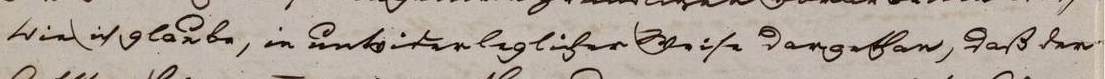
wie ich glaube, in unwiderleglicher Weise dargethan, daß der
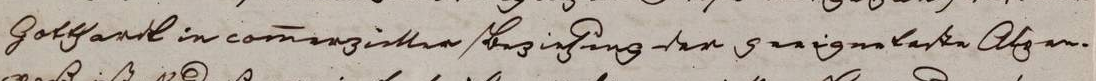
Gotthardt in commerzieller Beziehung der geeigneteste Alpen -
